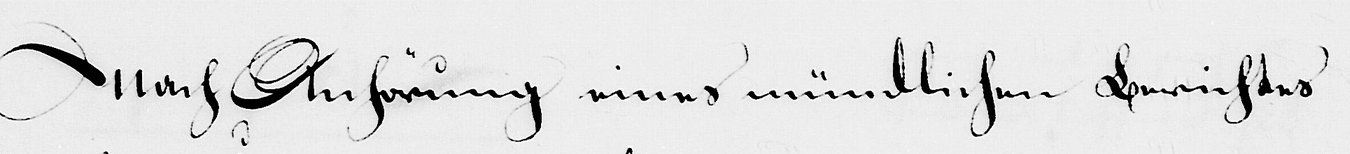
Nach Anhörung eines mündlichen Berichtes
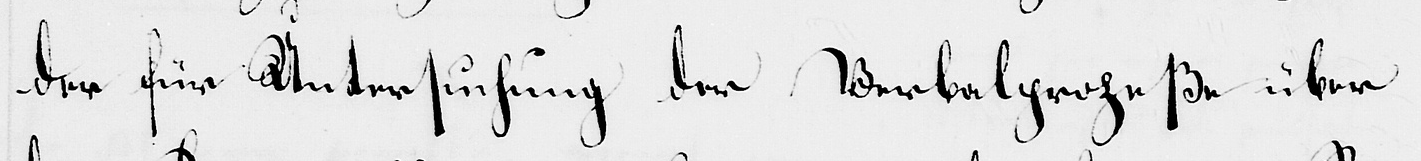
der für Untersuchung der Verbalprozeße über
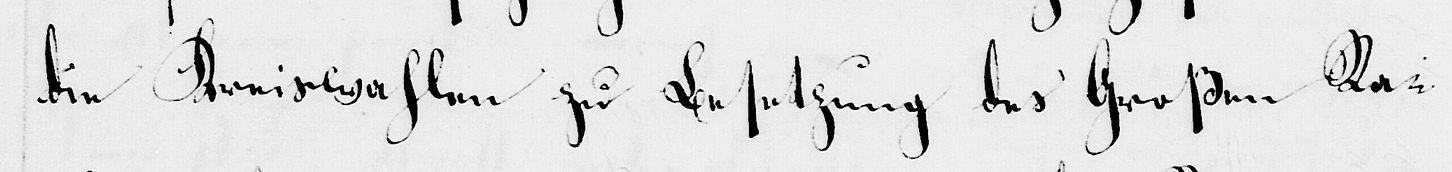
die Kreiswahlen zu Besetzung des Großen Ra¬
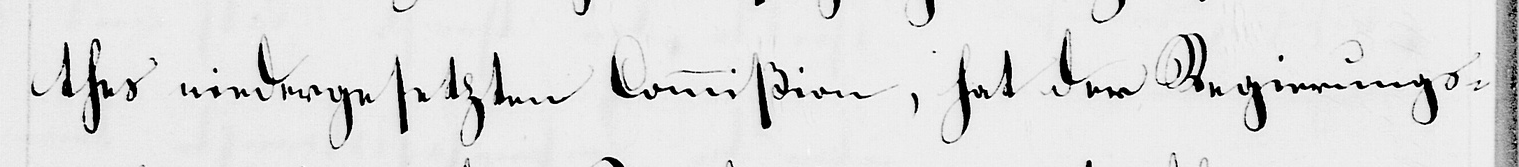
thes niedergesetzten Commißion, hat der Regierungs¬
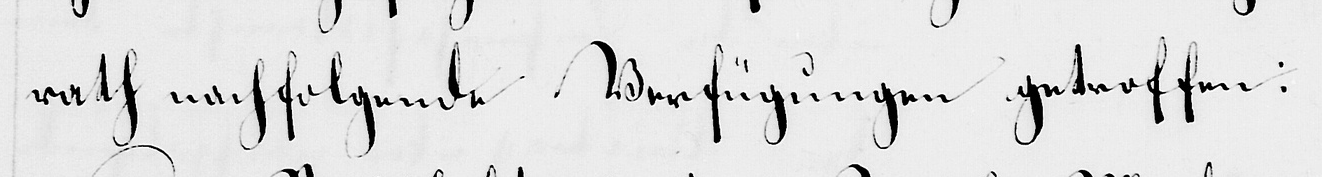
rath nachfolgende Verfügungen getroffen:
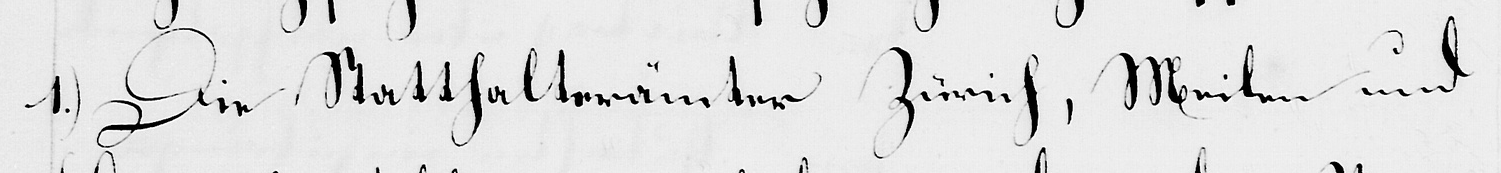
1.) Die Statthalterämter Zürich, Meilen und
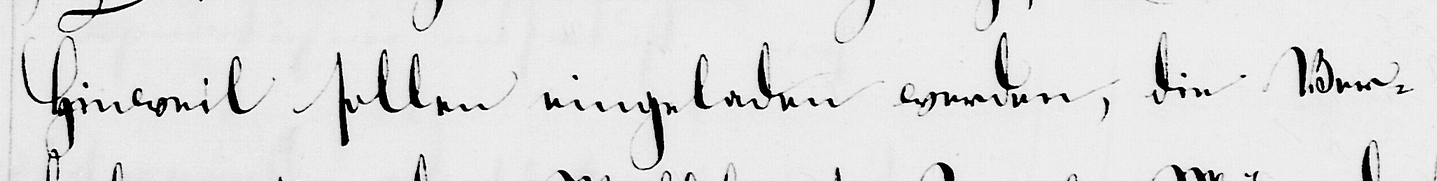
Hinweil sollen eingeladen werden, die Ver¬
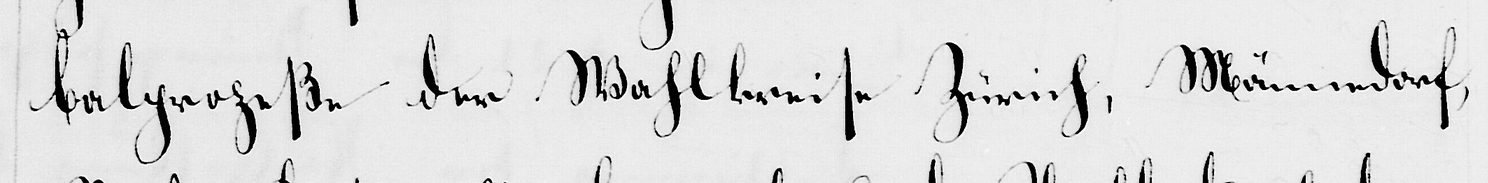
balprozeße der Wahlkreise Zürich, Männedorf,
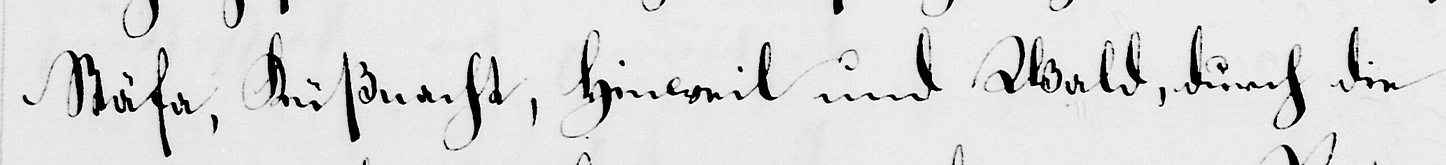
Stäfa, Küßnacht, Hinweil und Wald, durch die
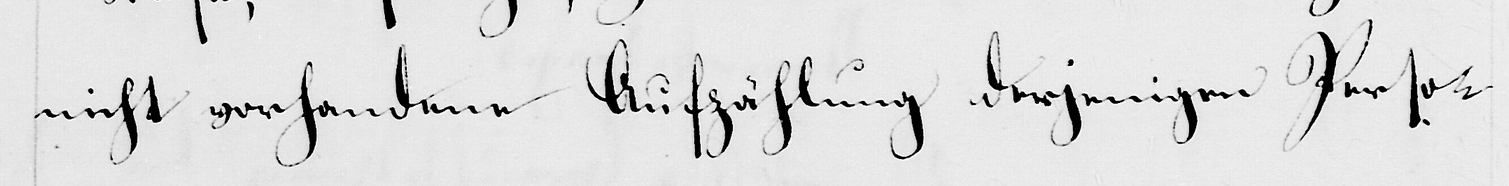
nicht vorhandene Aufzählung derjenigen Perso-
